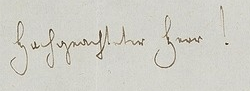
Hochgeachteter Herr!
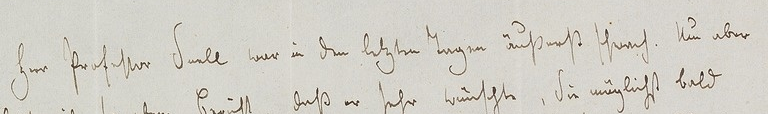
Herr Professor Snell war in den letzten Tagen äußerst schwach. Nun aber
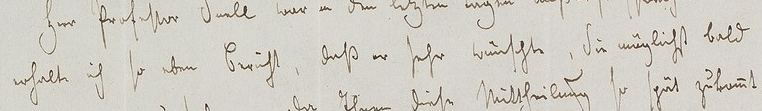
erhalte ich so eben Bericht, daß er sehr wünschte, Sie möglichst bald
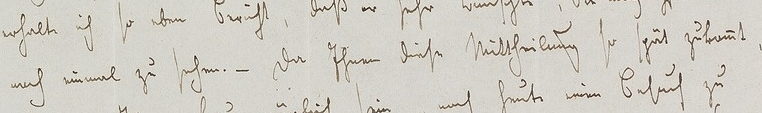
noch einmal zu sehen. – Da Ihnen diese Mittheilung so spät zukommt,
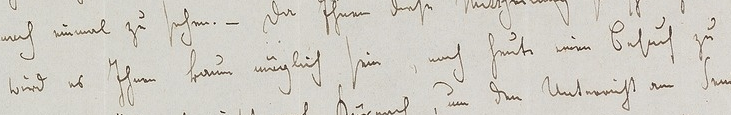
wird es Ihnen kaum möglich sein, noch heute einen Besuch zu
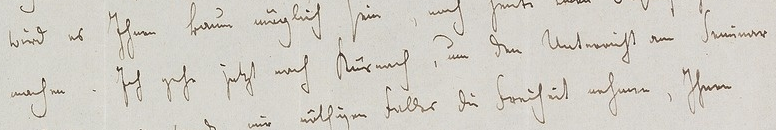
machen. Ich gehe jetzt nach Küsnach, um den Unterricht am Seminar
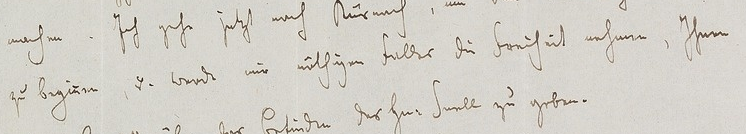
zu beginnen, & werde mir nöthigen Falles die Freiheit nehmen, Ihnen
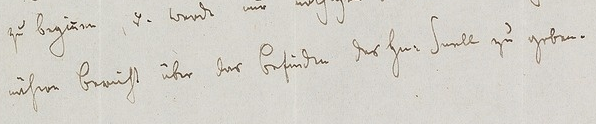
nähern Bericht über das Befinden des Hr. Snell zu geben.
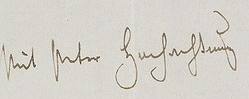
Mit steter Hochachtung
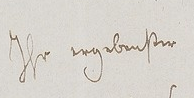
Ihr ergebenster
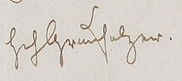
Hch Grunholzer.
